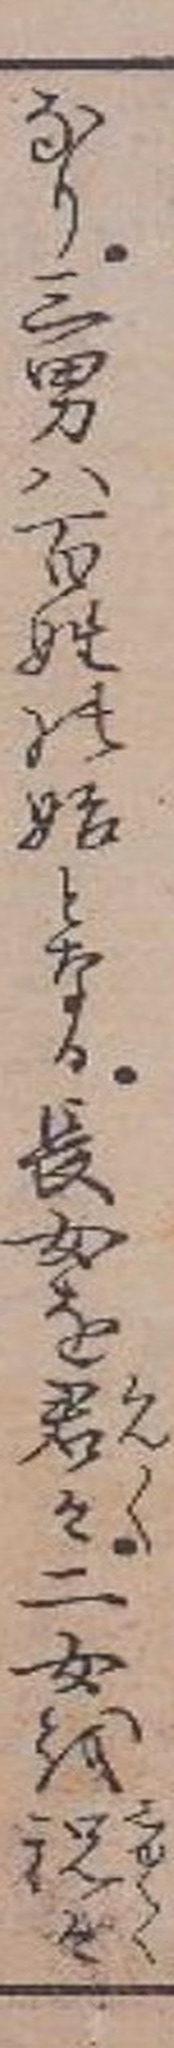なり、三男は百姓の始となる、長女を君々、二女を祝々
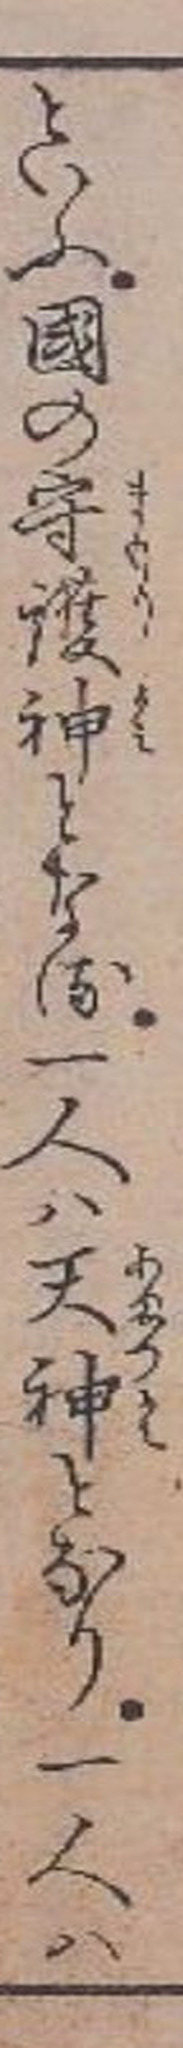といふ、国の守護神となる、一人は天神となり、一人は
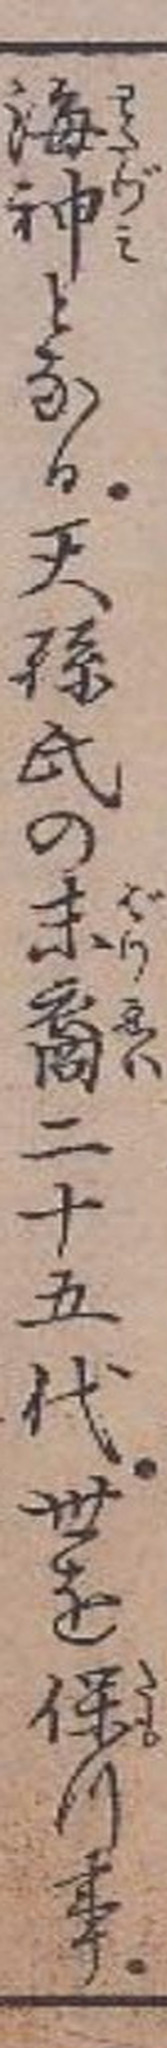海神となる、天孫氏の末裔二十五代、世を保つ事、
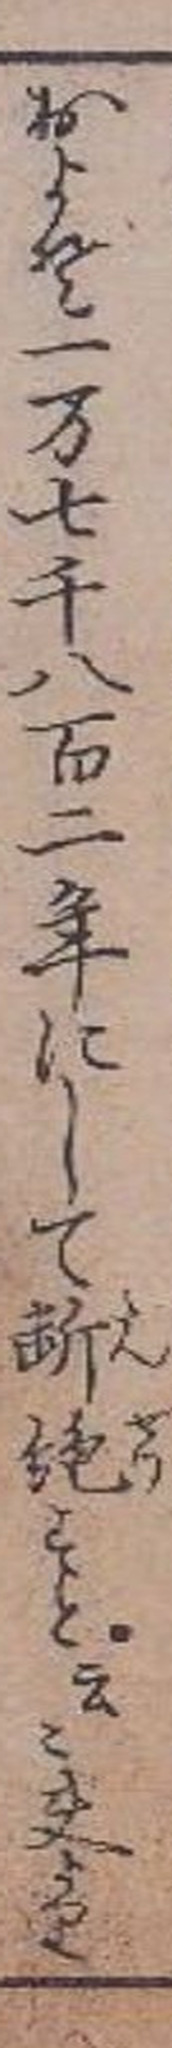およそ一万七千八百二年にして断絶すと、云々夫より

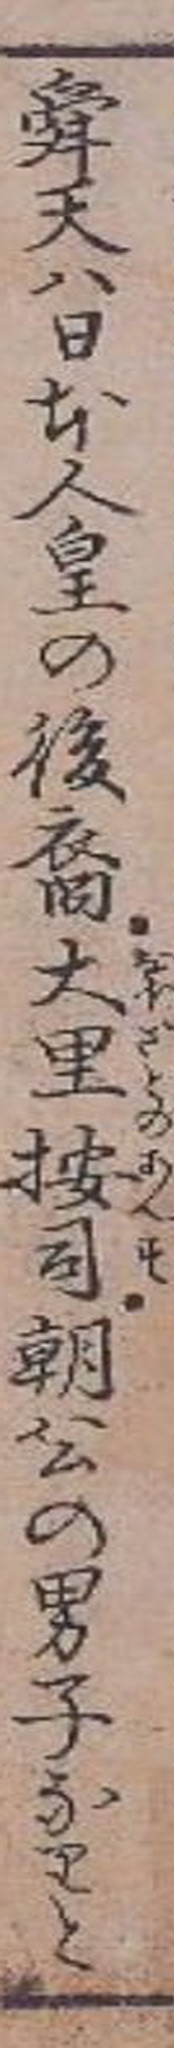舜天は日本人皇の後裔、大里按司、朝公の男子なりと
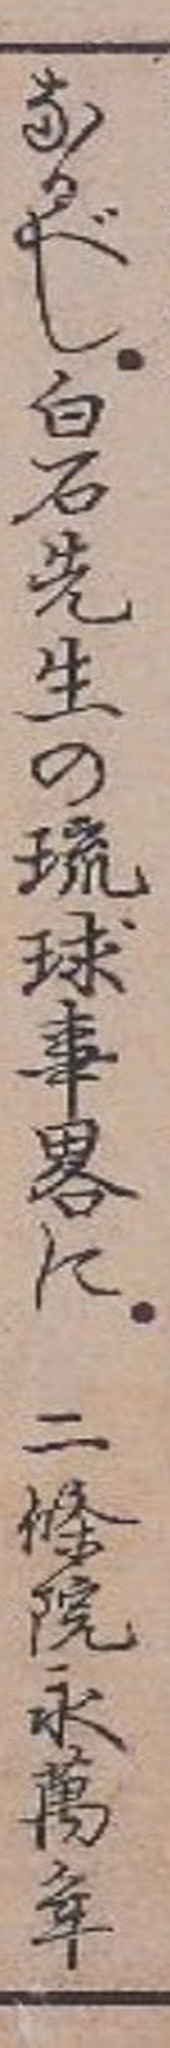なるべし、白石先生の琉球事略に、二条院永万年
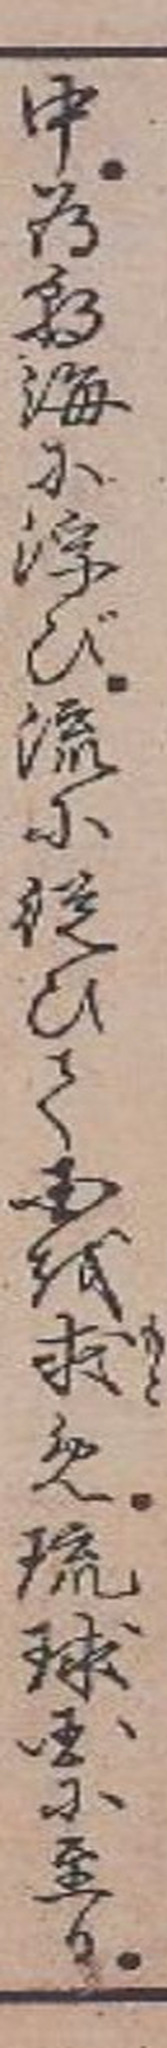中、為朝海に浮び、流に従ひて国を求め、琉球国に至り、
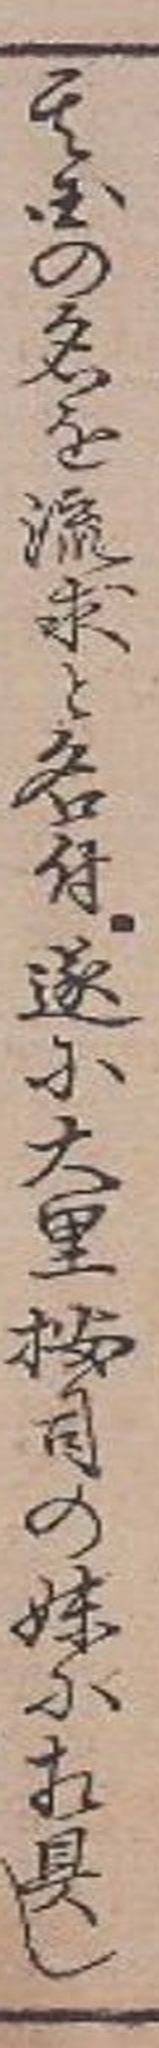其国の名を流求と名付、遂に大里按司の妹に相具し
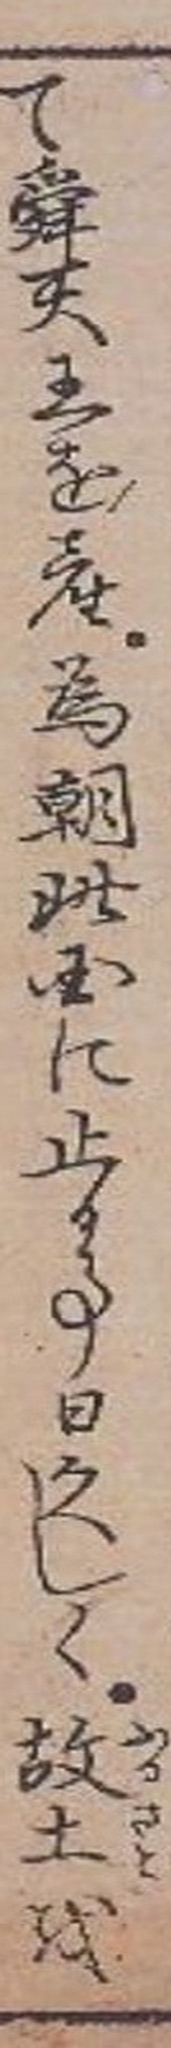て舜天王を産、為朝此国に止る事日久しく、故土を
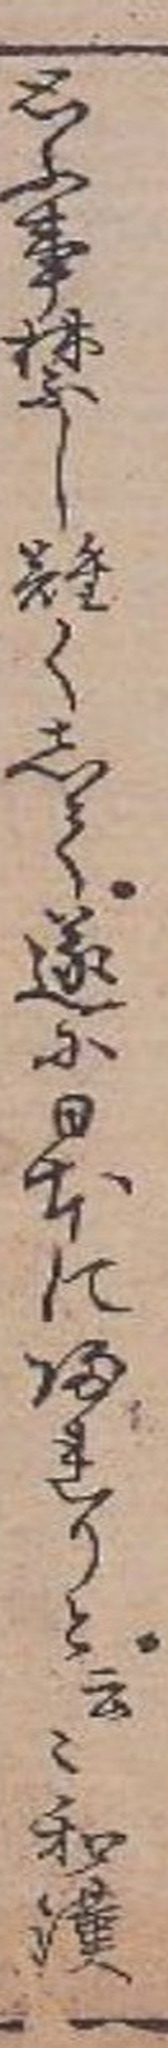思ふ事禁し難くして、遂に日本に帰れりと、云々和漢
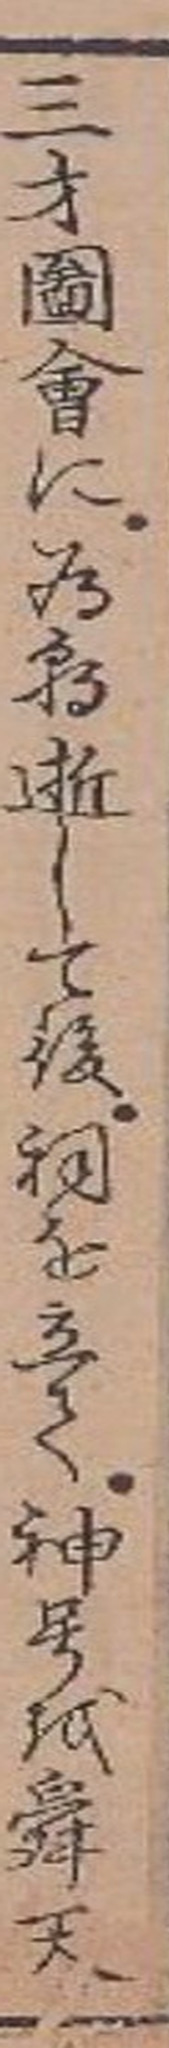三才図会に、為朝逝して後、祠を立て、神号を舜天
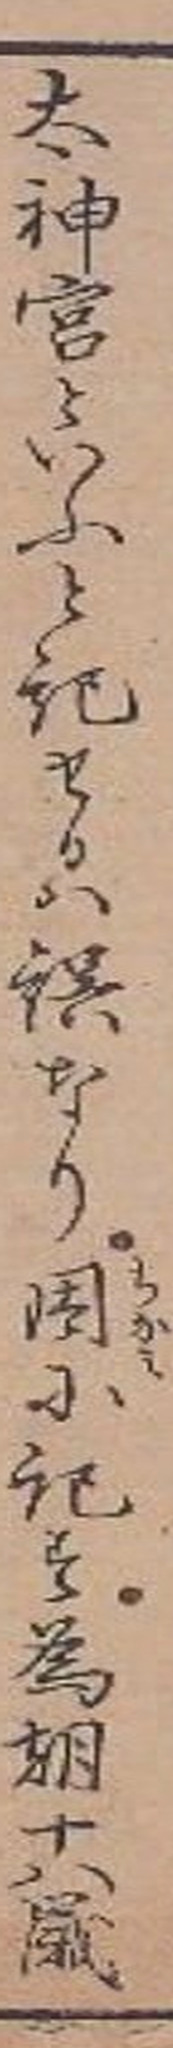太神宮といふと記せるは誤なり、因に記す、為朝十八歳
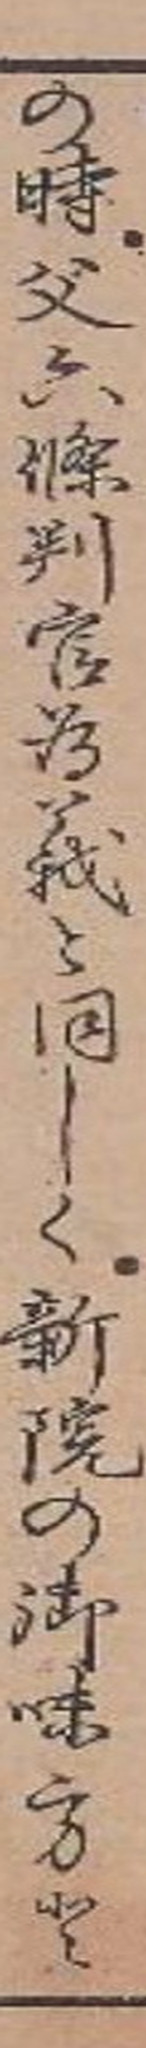の時、父六条判官為義と同しく、新院の御味方と
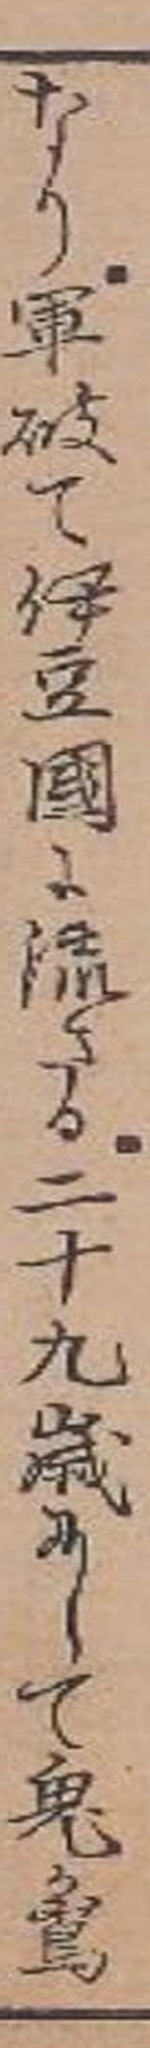なり、軍破て伊豆国に流さる、二十九歳にして鬼か島
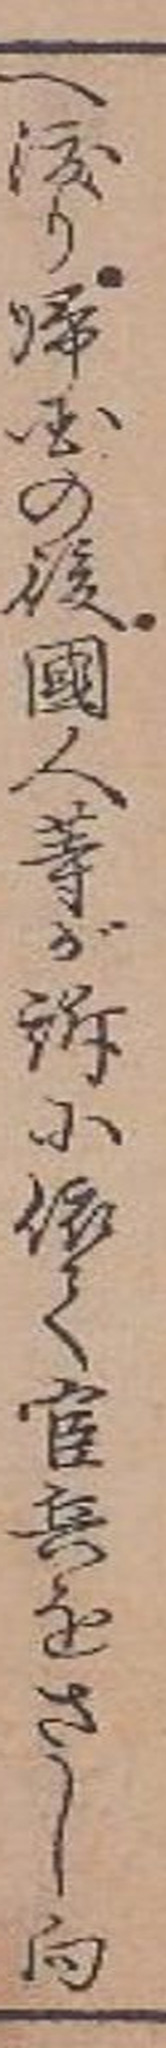へ渡り、帰国の後、国人等が訴に依て官兵をさし向
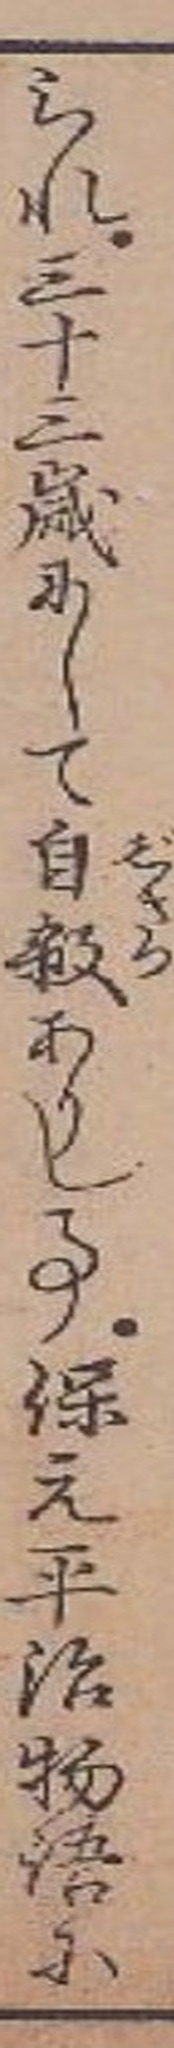られ、三十三歳にして自殺ありし事、保元平治物語に
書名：琉球談
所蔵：University of the Ryukyus Library
